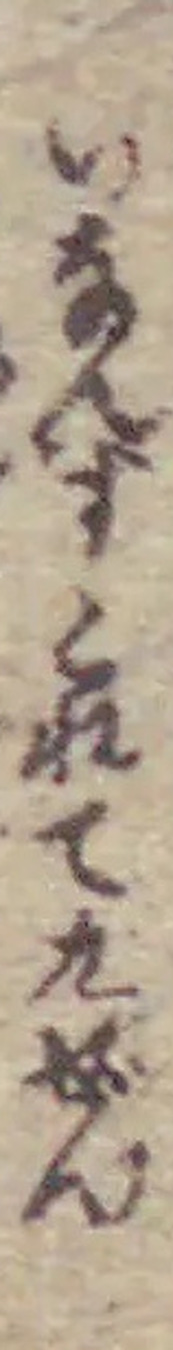いなんすこれて九ぜん
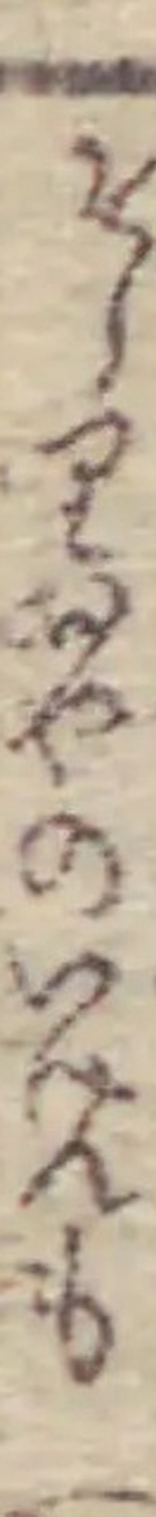そしりおやのいけんも
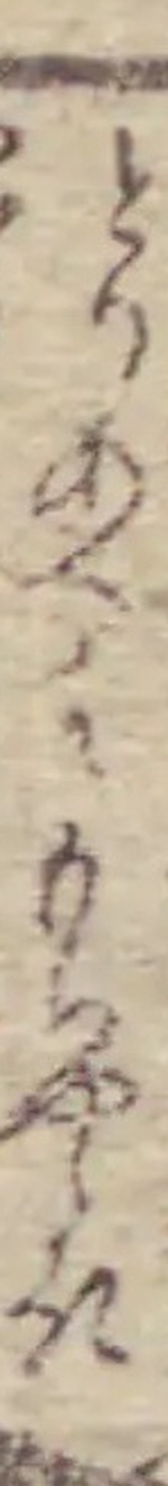とりあへすもらやき
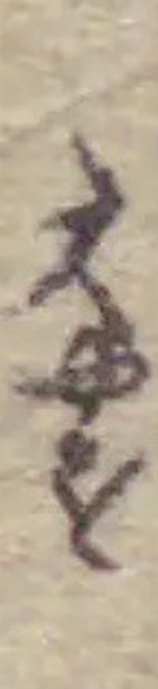たへやす
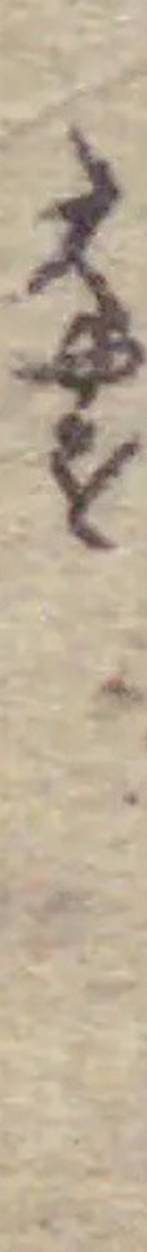たへやす
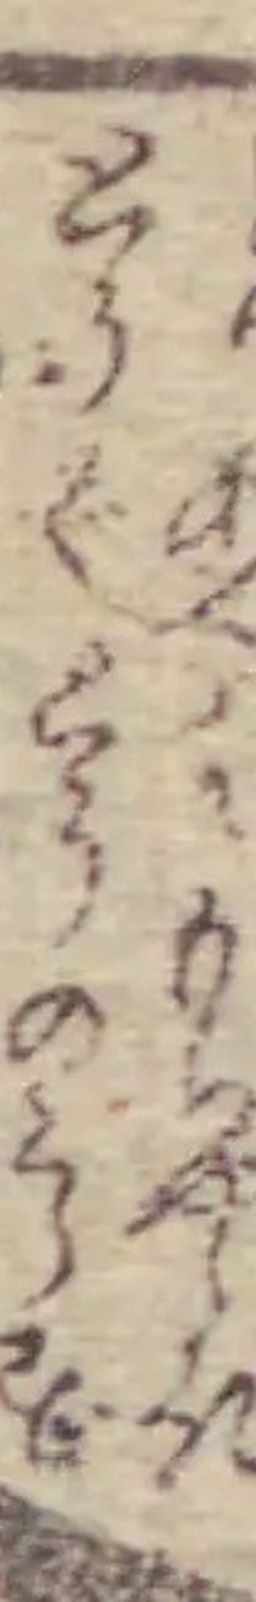とうぐとうのこらず
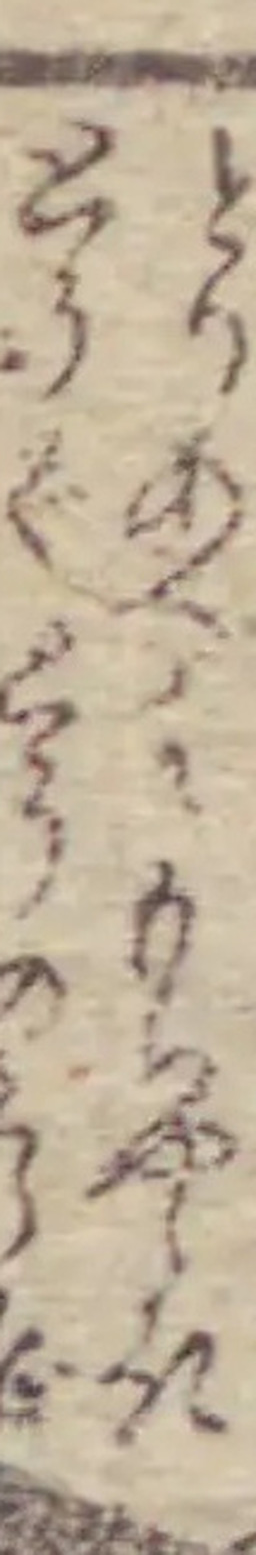とうぐとうのこらず
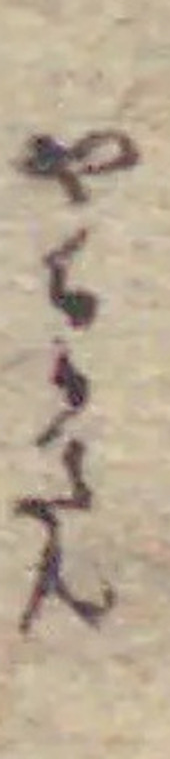やてうさん
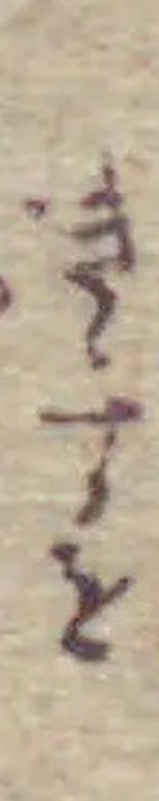きゝすを
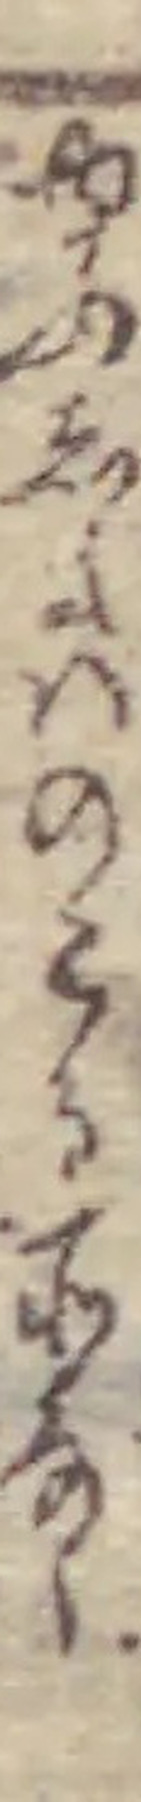ゆふしよはのこる所なく
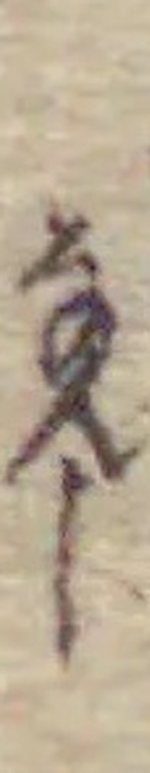なんし
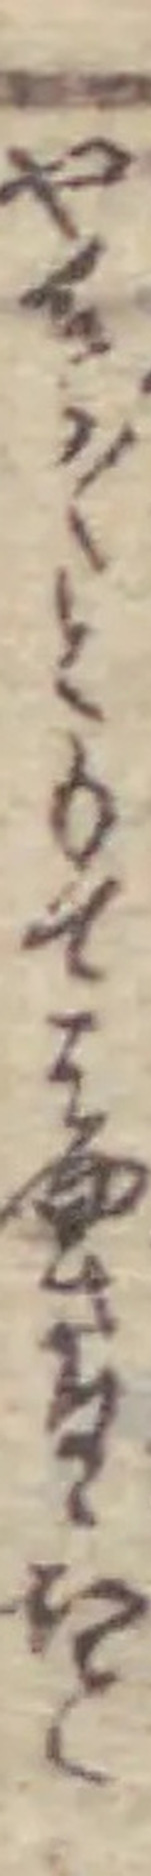やてう〳〵ともてはやさるゝほと
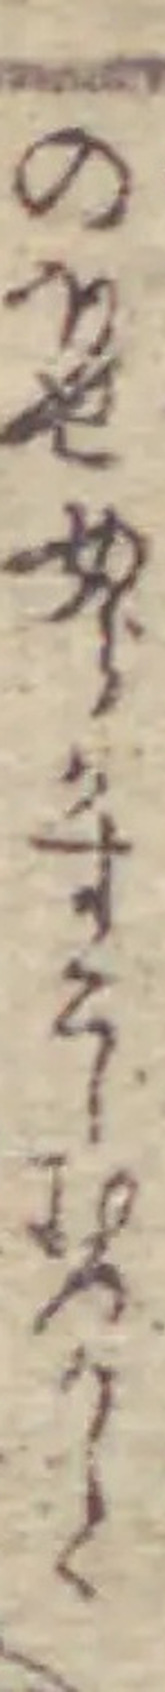のほせ女郎がすこしむつかしく
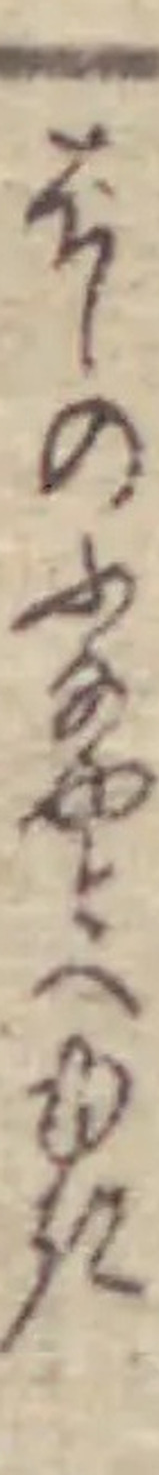ばしのふなやとへゆき
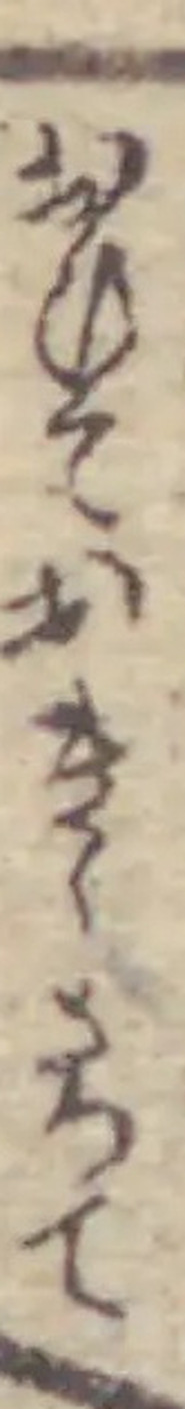おひておきゝ？さつて
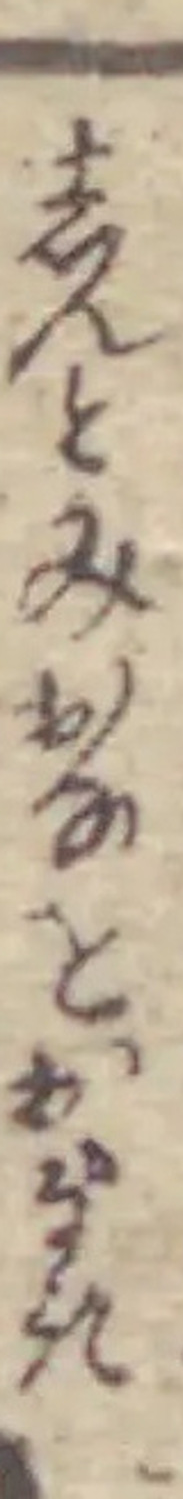しんとみおなをおまき
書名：夜野中狐物 2巻
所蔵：国立国会図書館 National Diet Library, JAPAN
